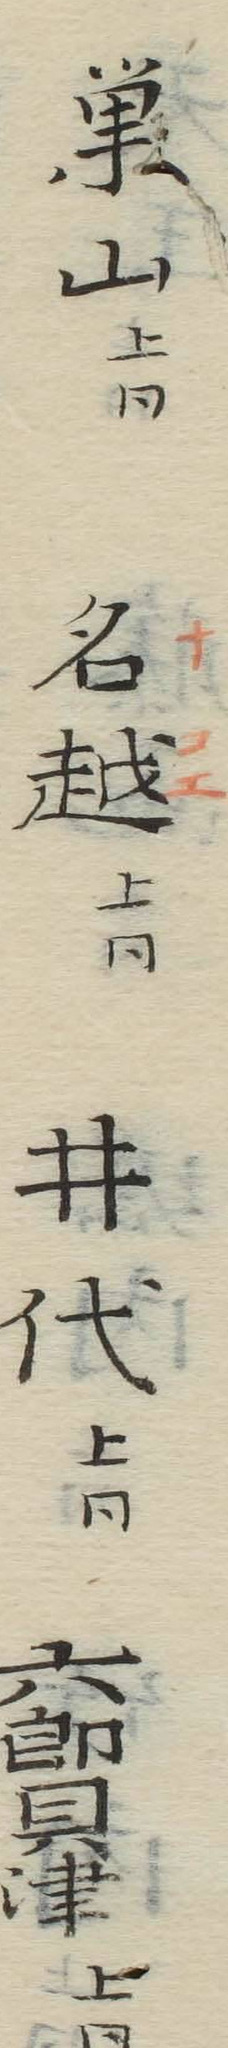巣山上同名越上同井代上同六即貝津上同
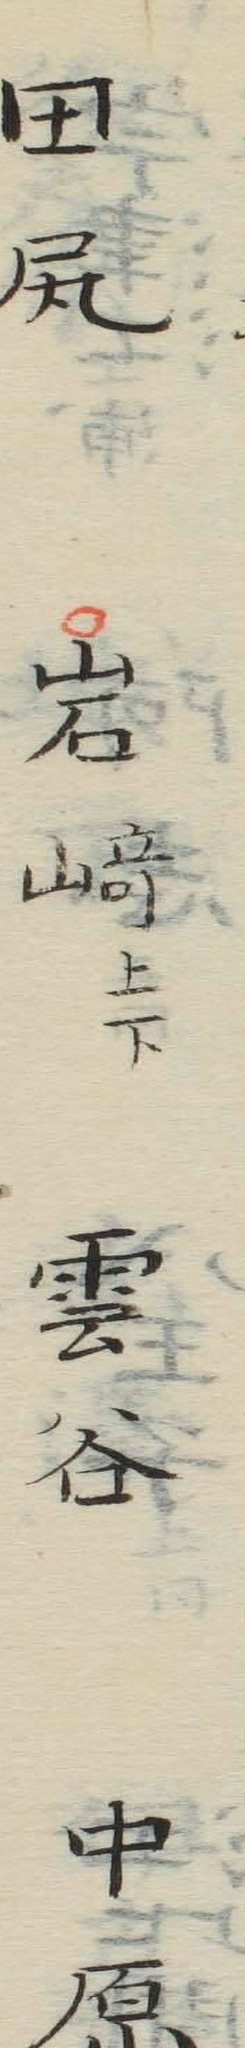田尻○岩崎上下雲谷中原
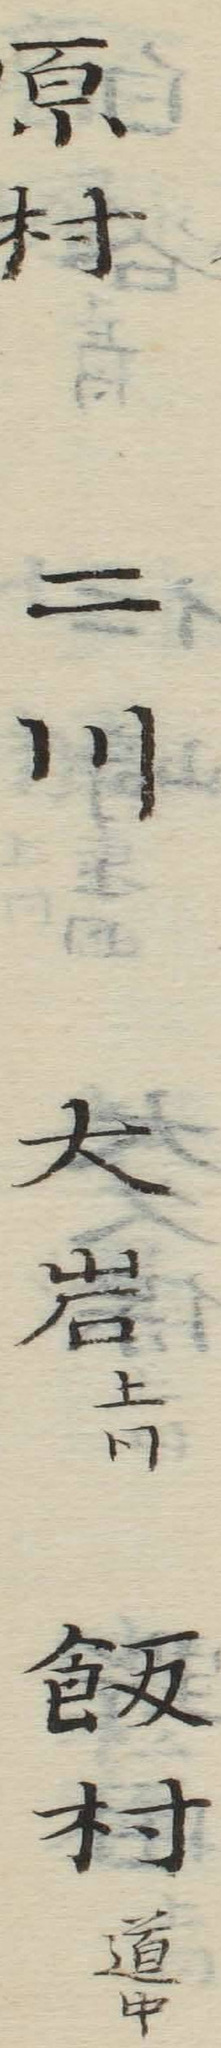原村二川大岩上同飯村道中

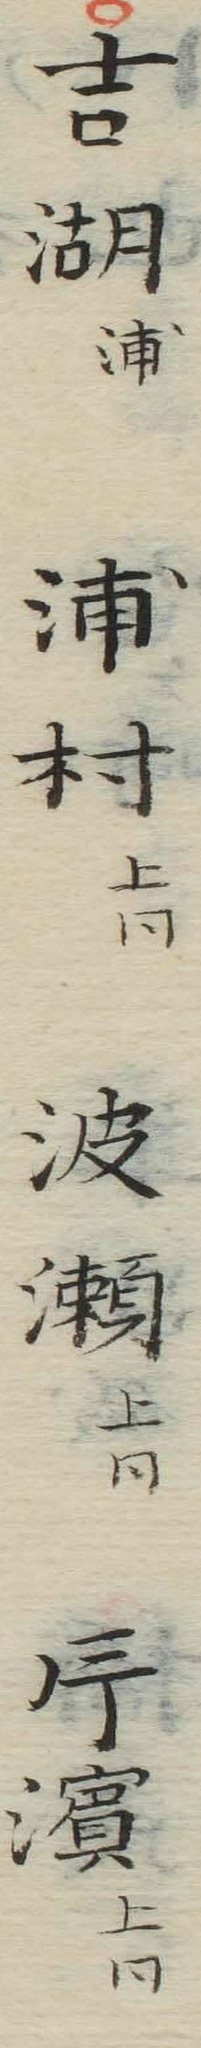○𠮷湖浦浦村上同波瀬上同片濱上同
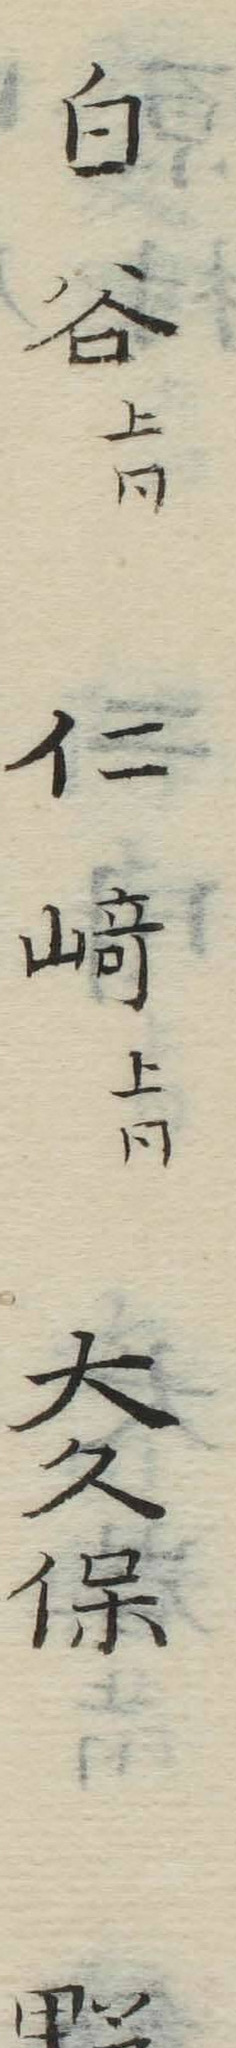白谷上同仁﨑上同大久保野田
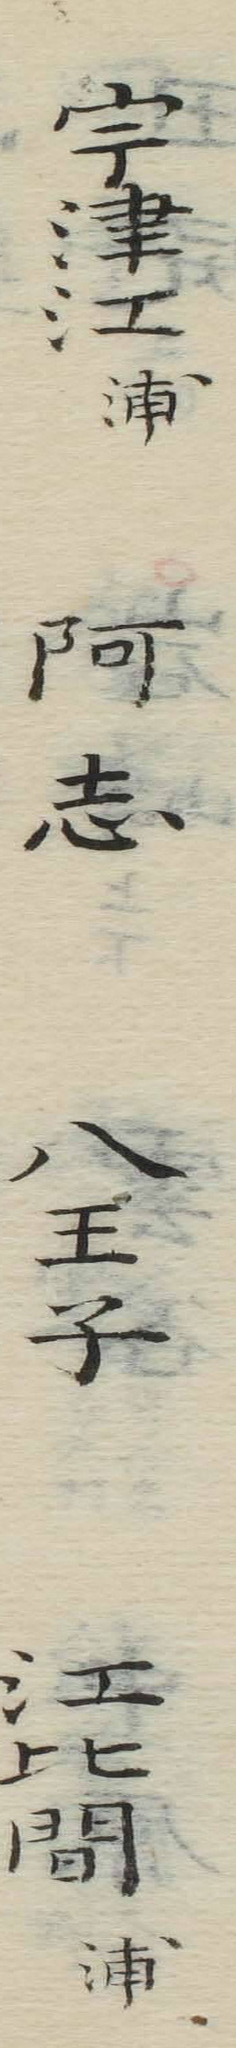宇津江上同阿志八王子江比間浦
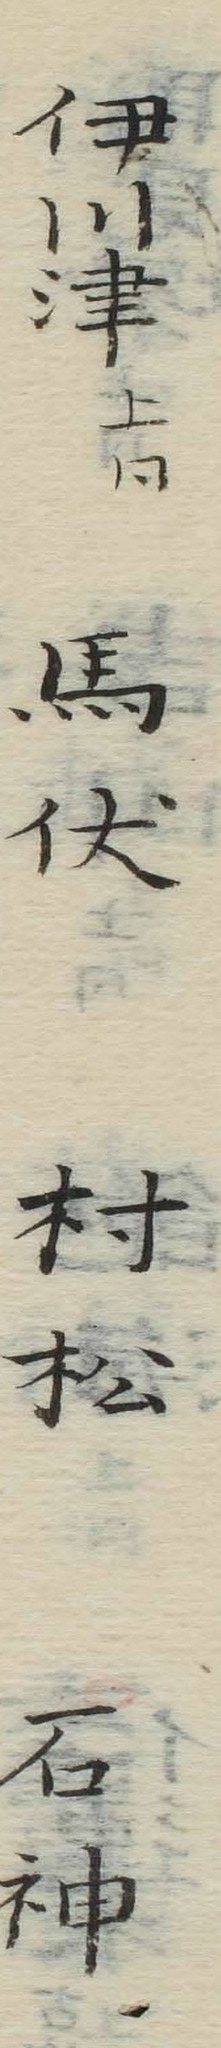伊川津上同馬伏村松石神
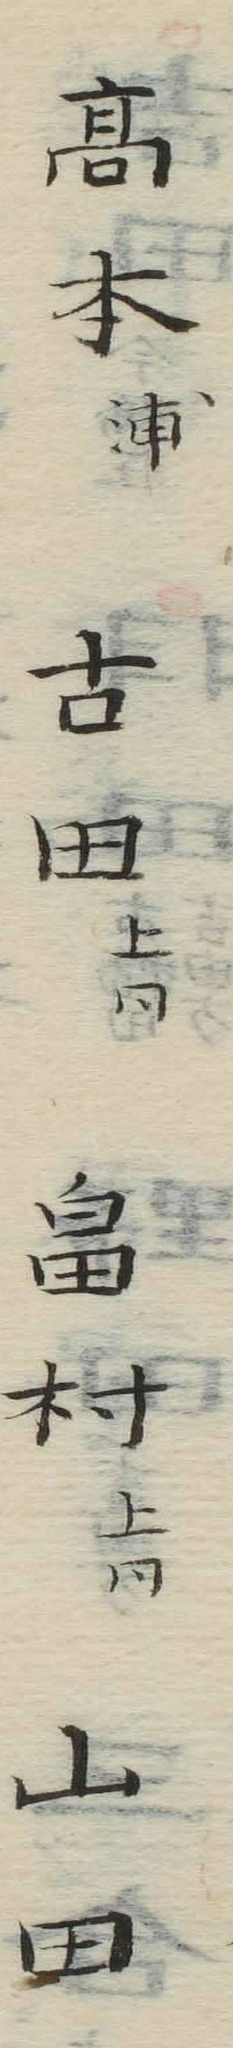髙木浦古田上同畠村上同山田
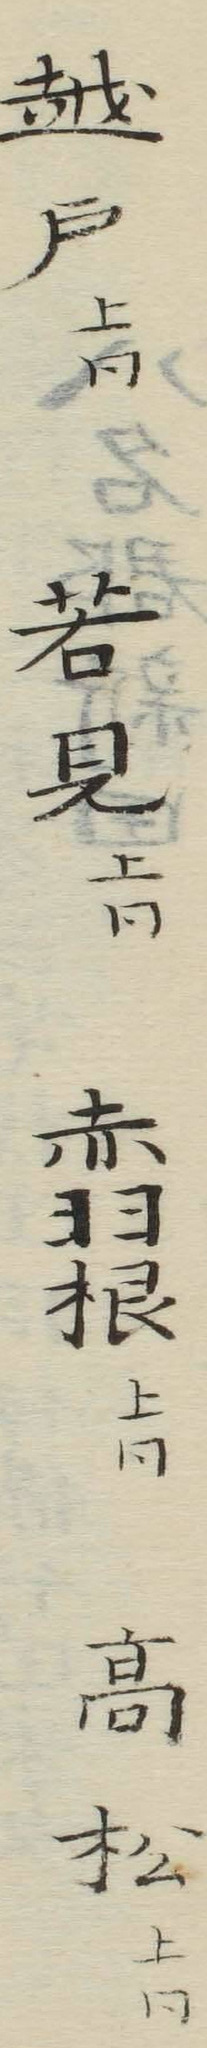越戸上同若見上同赤羽根上同髙松上同
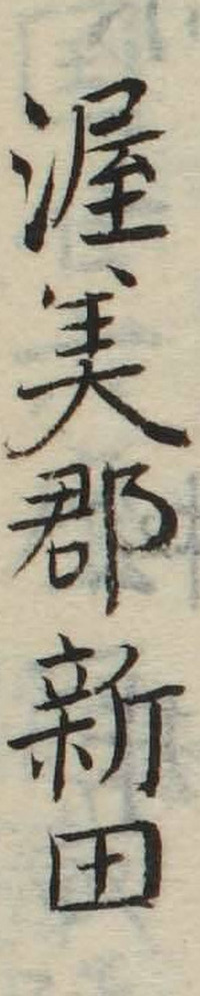渥美郡新田

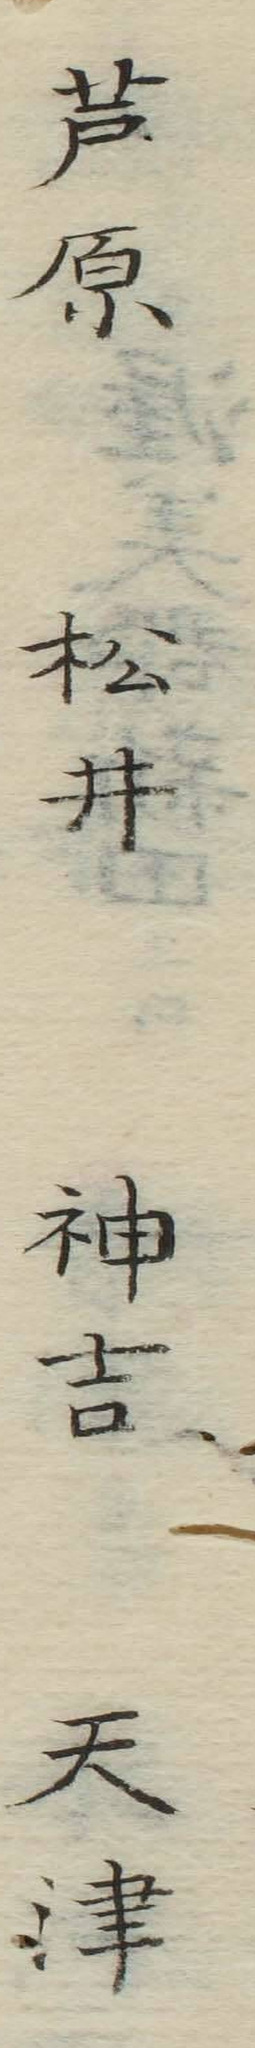芦原松井神吉天津
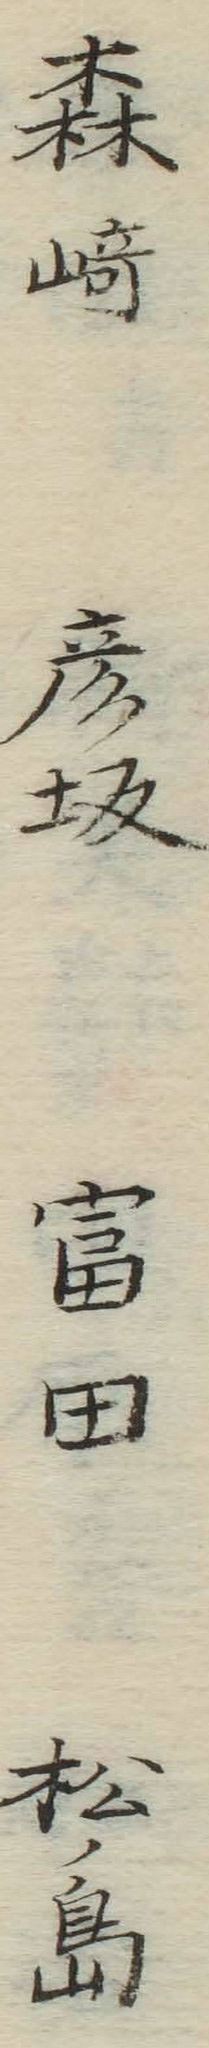森崎彦坂富田松島
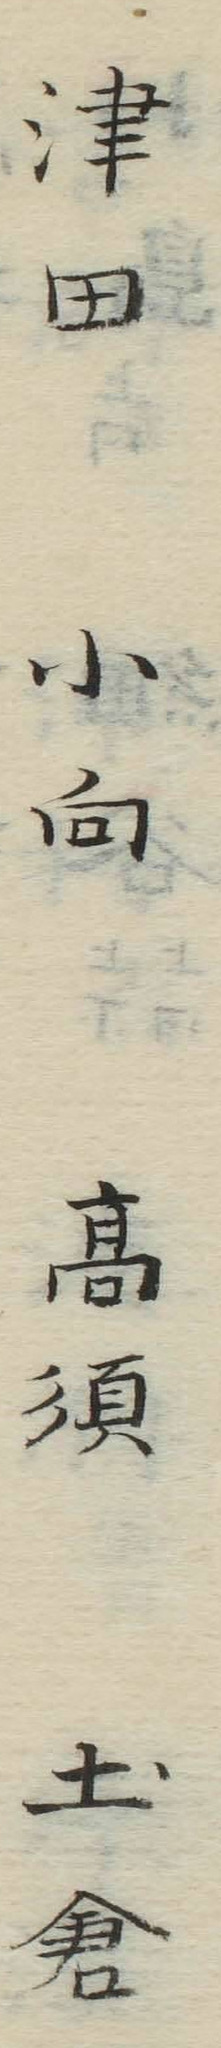津田小向高須土倉
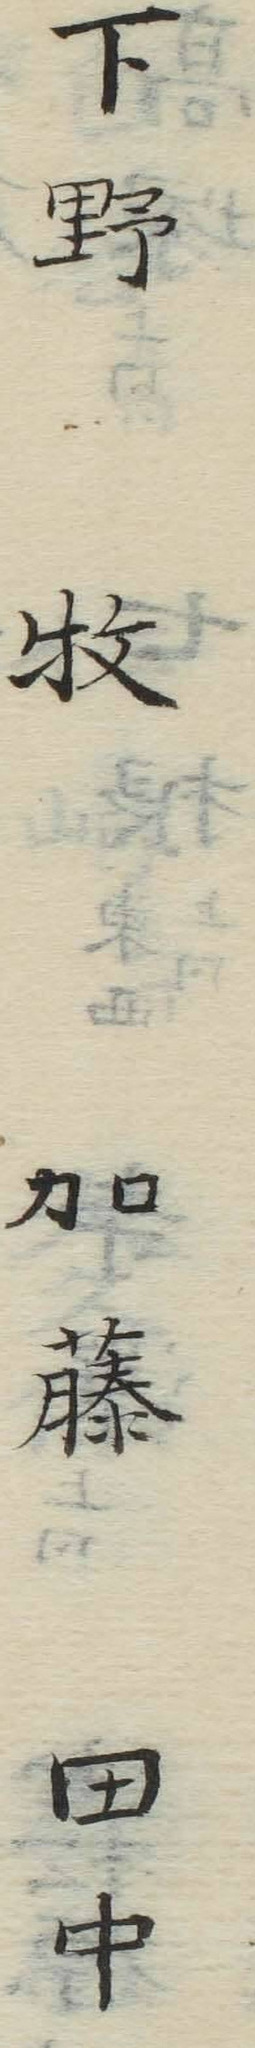下野牧加藤田中
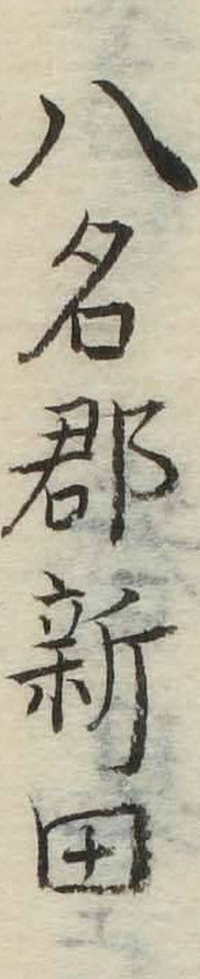八名郡新田
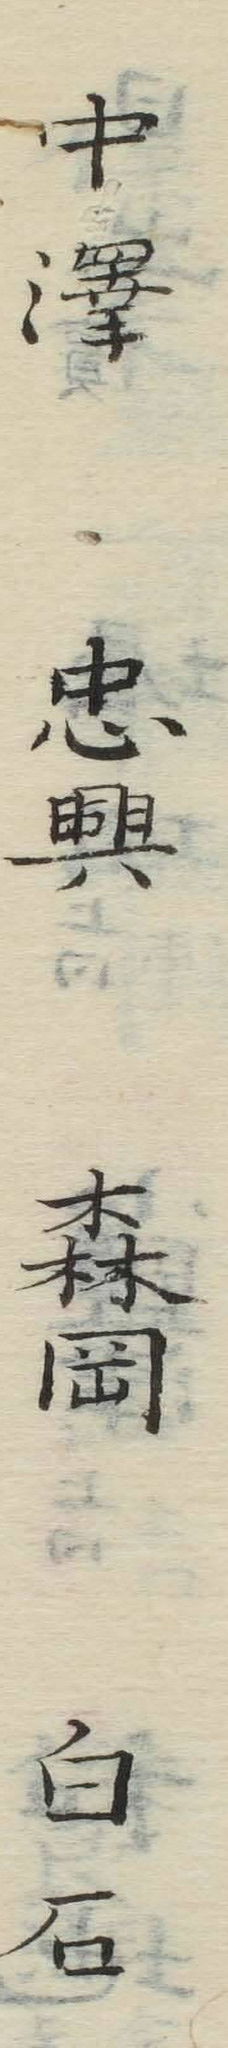中沢忠興森岡白石
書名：三河国二葉松
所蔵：国文学研究資料館
